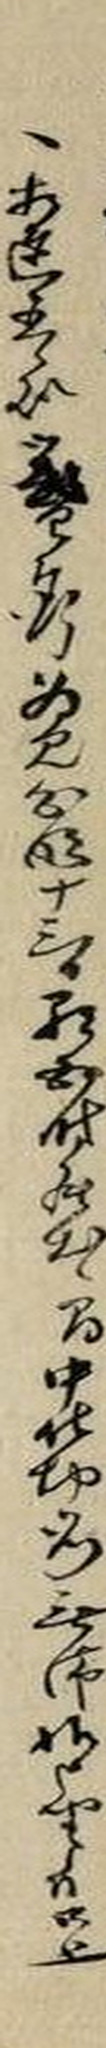へ相達置候処御武具奉行為見分明十三日朝五時罷出候間中仕切御門無滞様申聞候に付口上
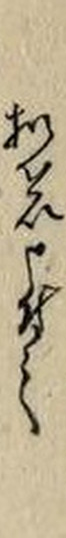扣を以申付之
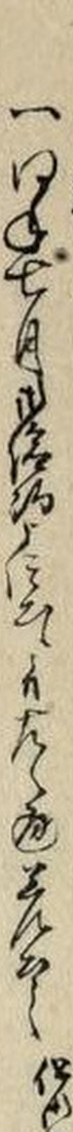一同年七月御倹約被仰出候に付左之通差出之
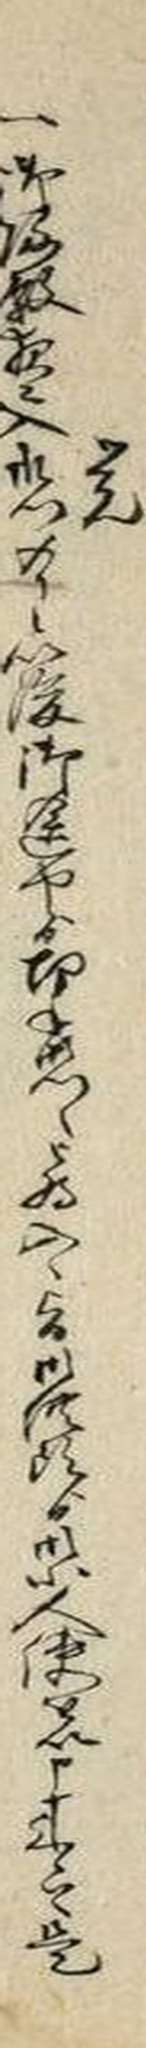一御帰殿夜に入御門〆り候以後御途中ゟ切手御門へ被為入候旨御供頭ゟ御小人使を以申来候はゝ是
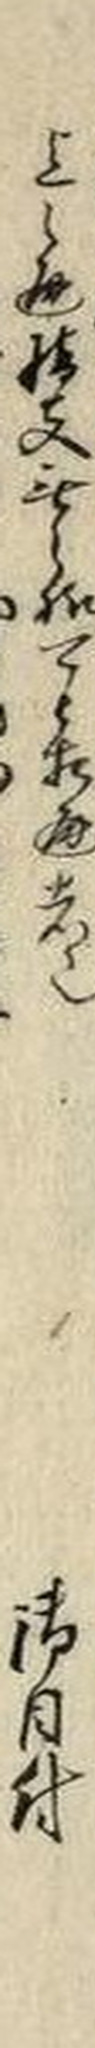迄之通指支無之様可被相通者也御目付
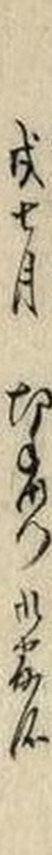戌七月切手御門御番所
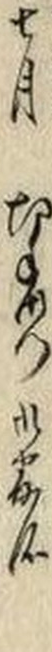切手御門御番所
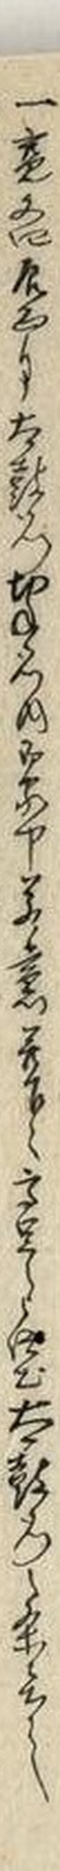一寛文四辰正月太鼓御門切手御門内御家中若党并下々高足被仰出太鼓御門之条に出之
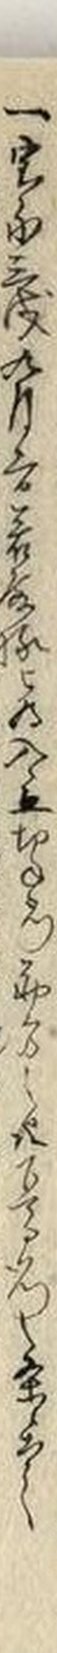一宝永三戌九月二三日若殿様被為入候上切手御門勤方之儀下馬御門所之条に有之
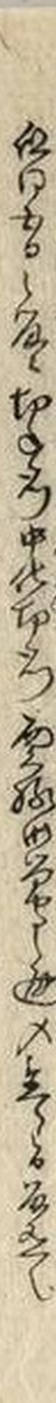但同五日之留に切手御門中仕切御門殿様御留守之通〆置候旨留有之
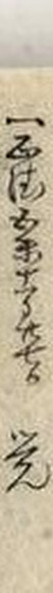一正徳五未十一月廿七日覚
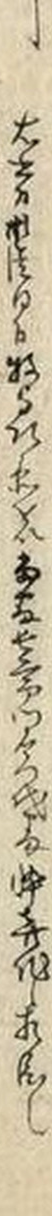右書付御徒目付牧与次兵衛を以当番長谷部門右衛門代番忰喜作へ相渡之
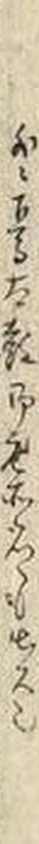外ニ下馬太鼓御座所御門へも出ス也
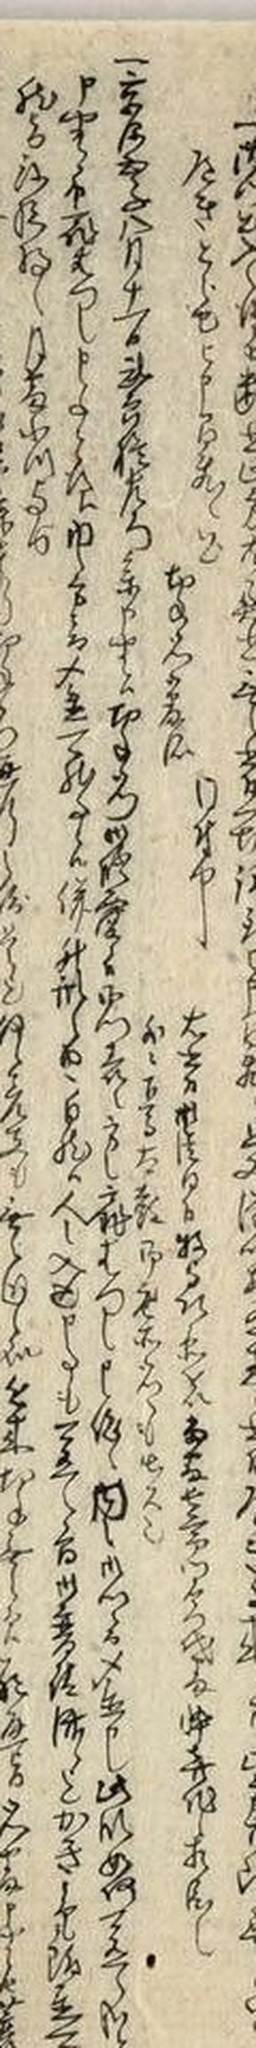一享保五子八月十一日武曽権左衛門参申聞候は切手御門御修覆に付御門表之方之扉はつし申候依之内之御門に而〆置申候此段如何可有之哉と
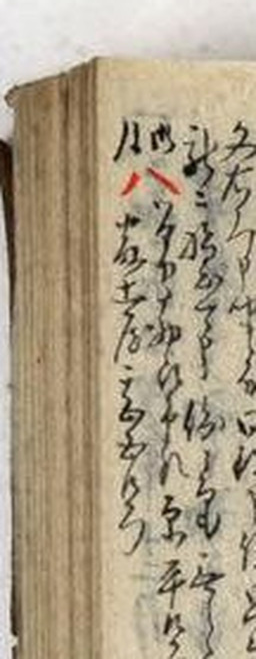月番土屋甚五左衛門

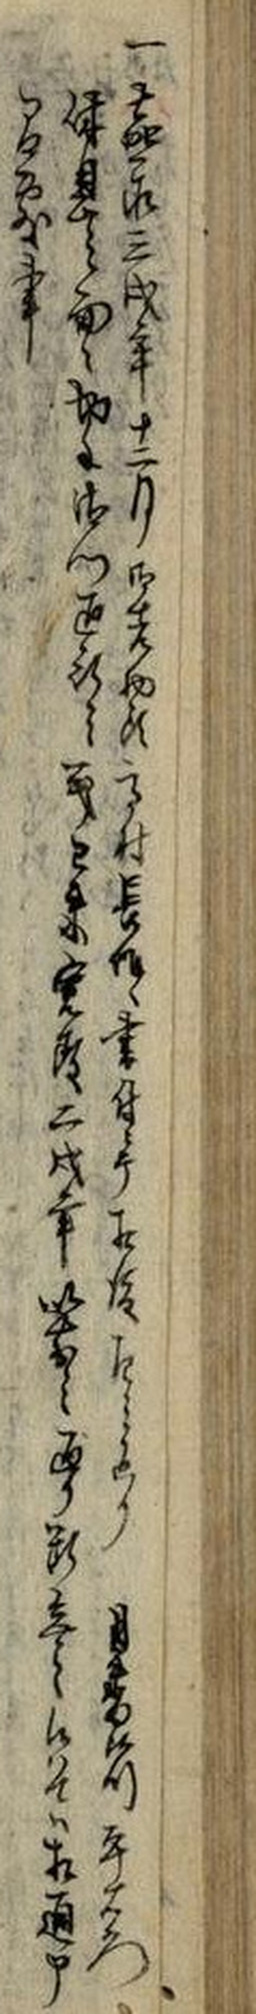一嘉永三戌年十二月御先物頭高村長作へ書付にて相渡左之通り御番奉行平左衛門
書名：御門御櫓之部
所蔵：福井県文書館 Fukui Prefectural Archives
